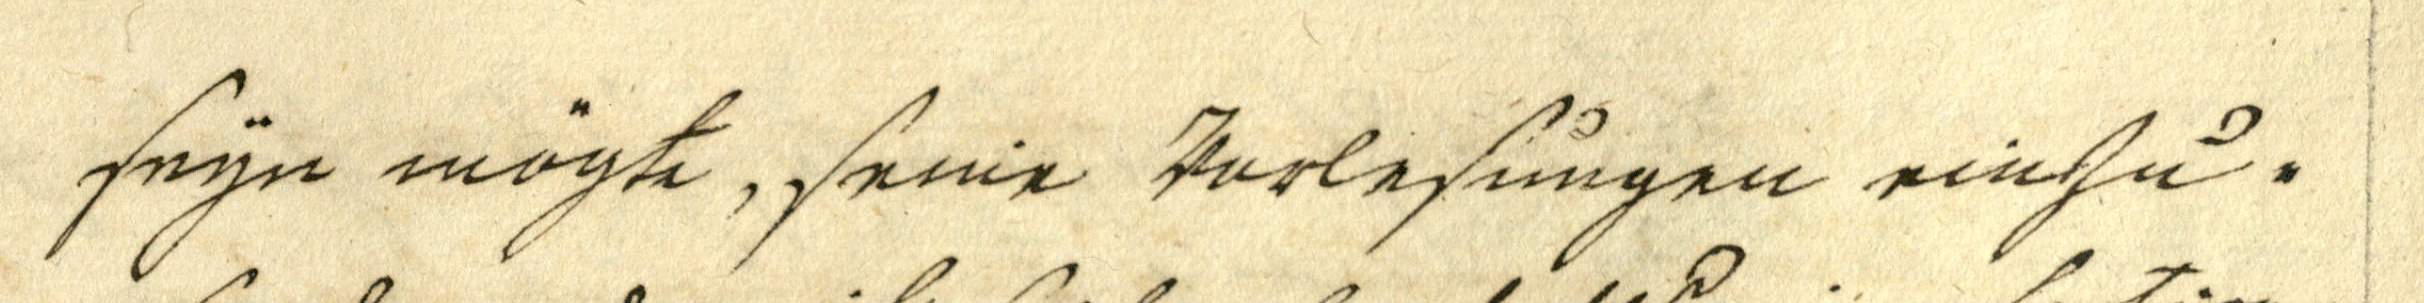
seÿn mögte, seine Vorlesungen einzu¬
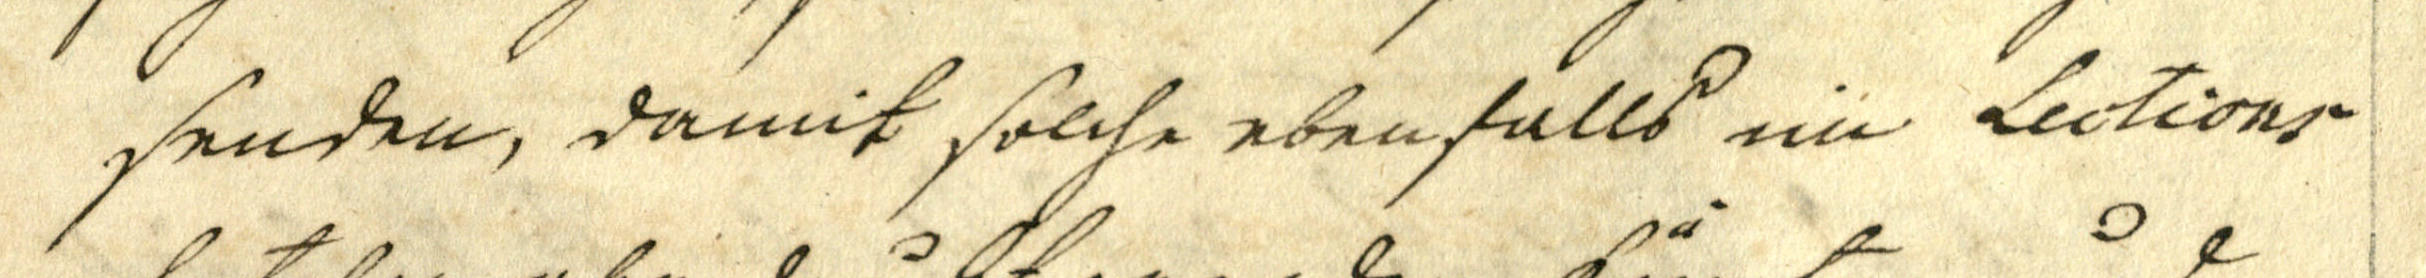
senden, damit solche ebenfalls im Lections
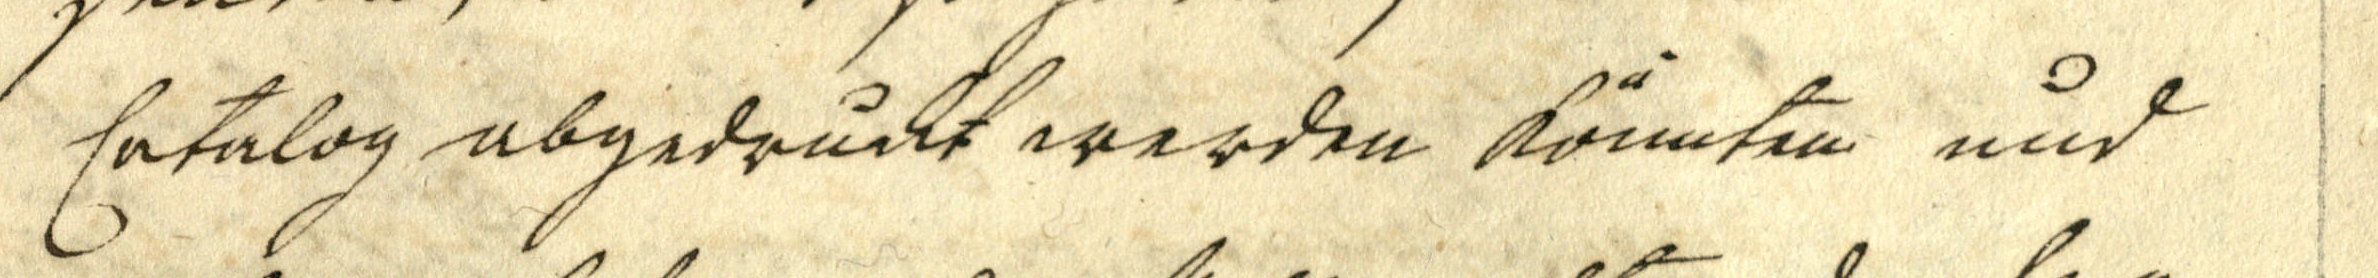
Catalog abgedruckt werden könnten und
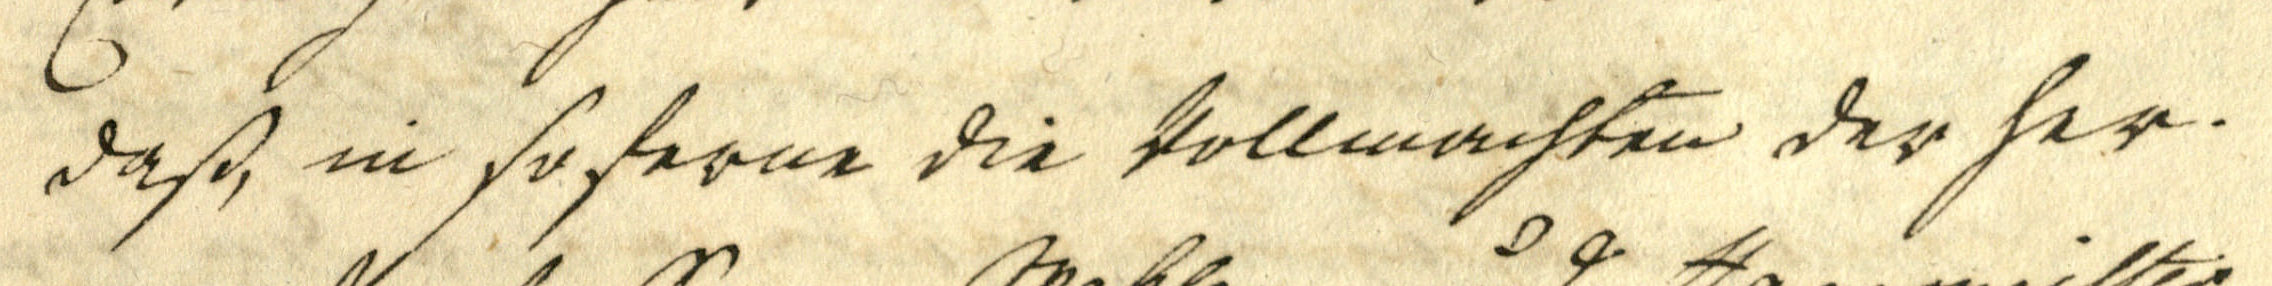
daß, in so ferne die Vollmachten der Her¬
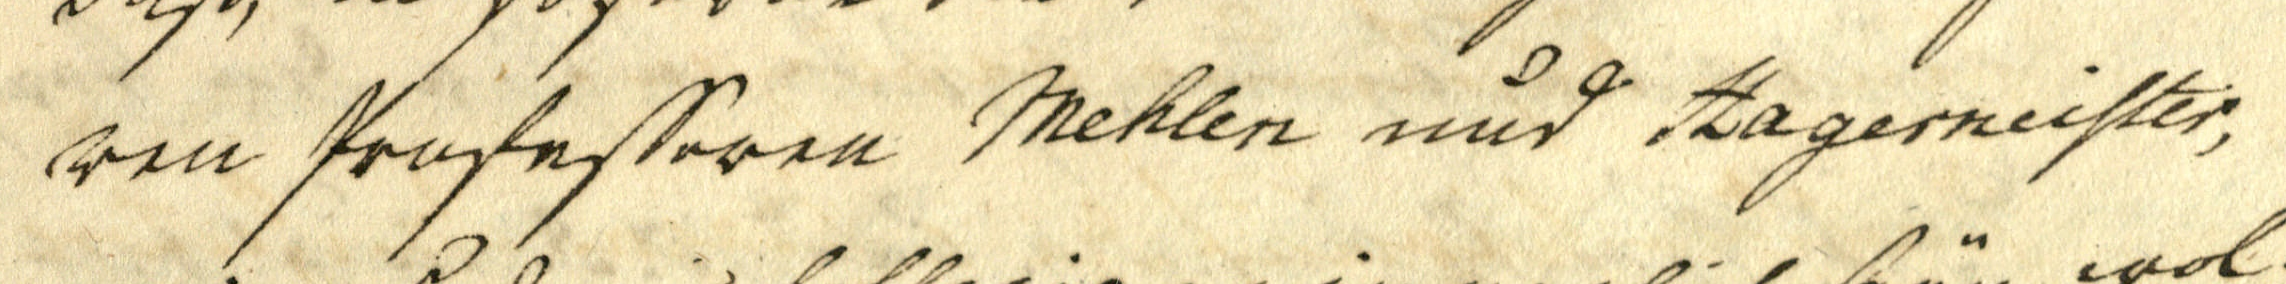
ren Professoren Mehlen und Hagemeister,
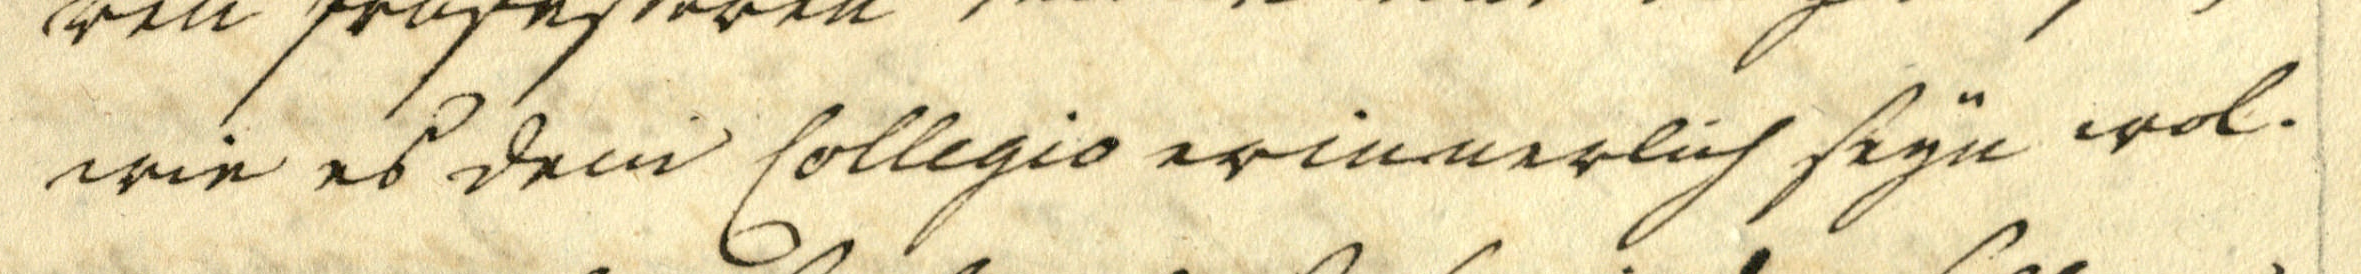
wie es dem Collegio erinnerlich seÿn wol¬
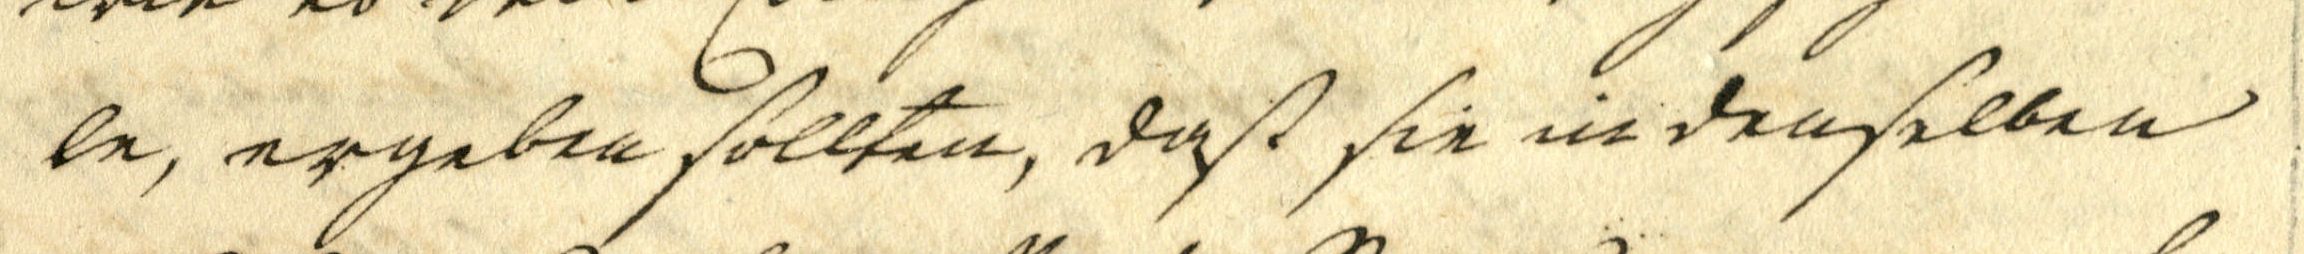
le, ergeben sollten, daß sie in denselben
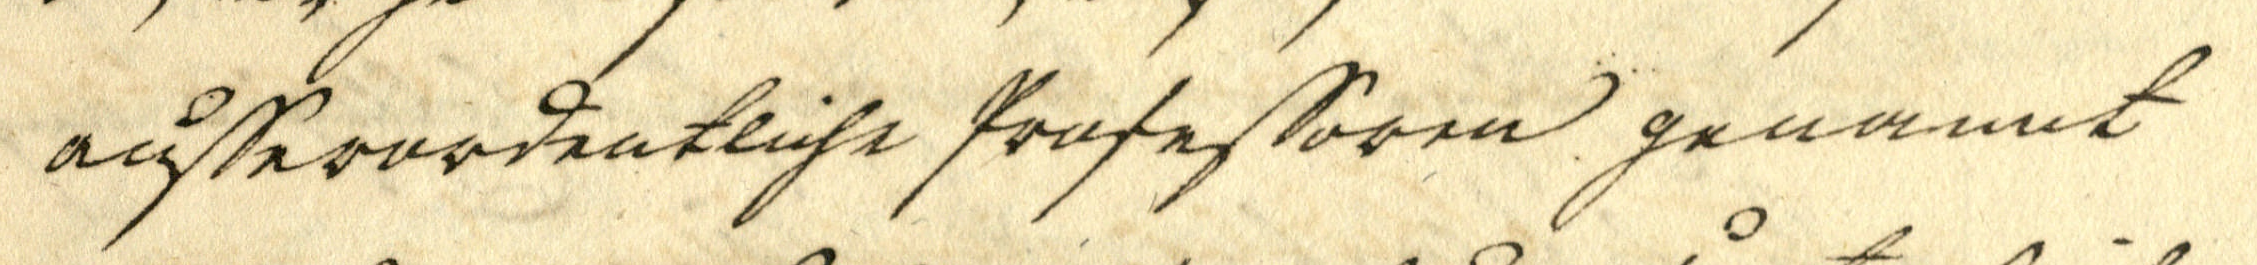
ausserordentliche Professoren genannt
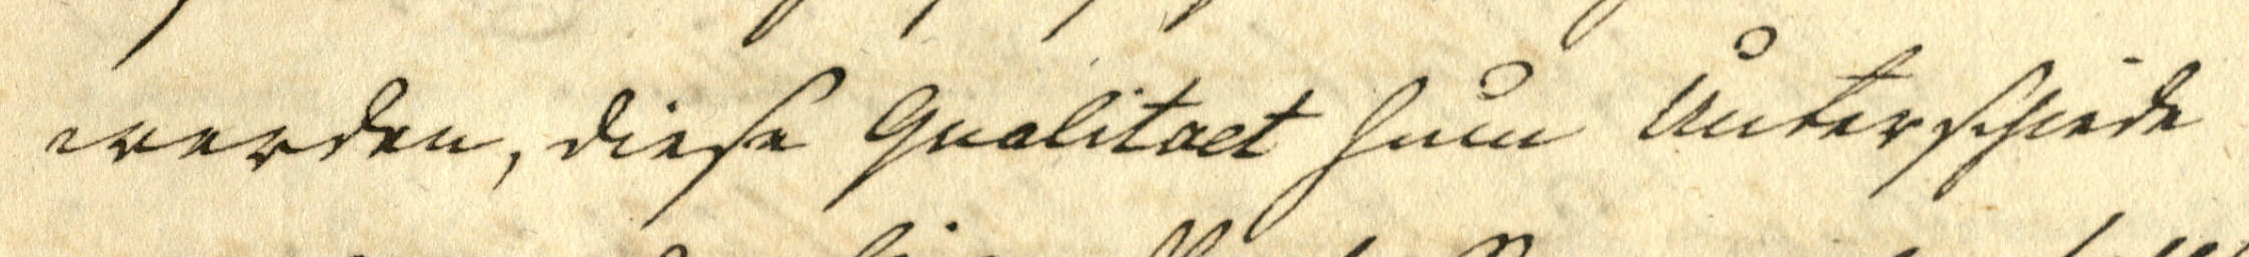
werden, diese Qualitaet zum Unterschiede
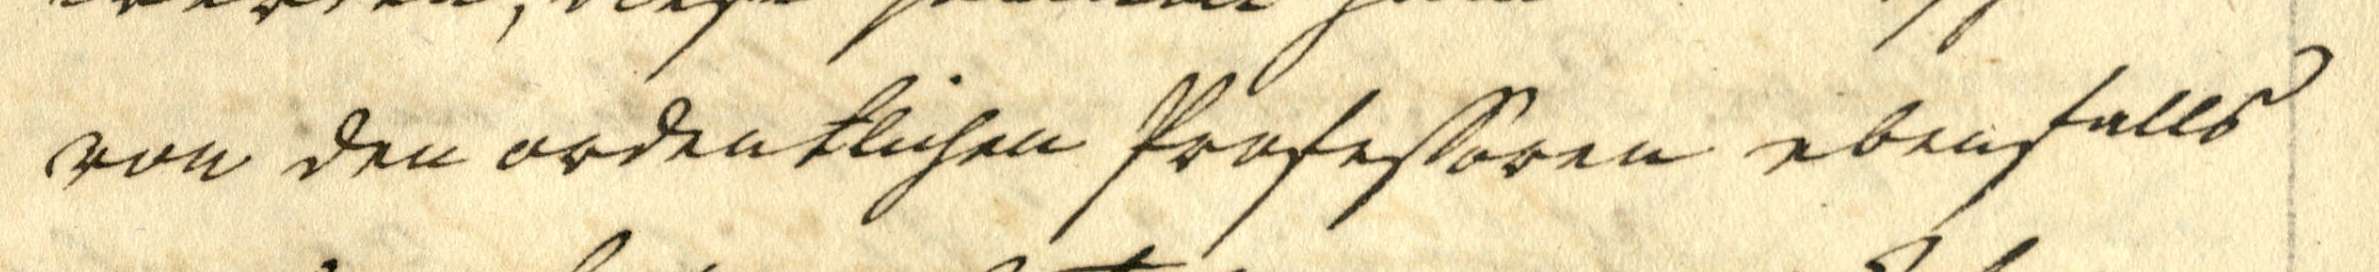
von den ordentlichen Professoren ebenfalls
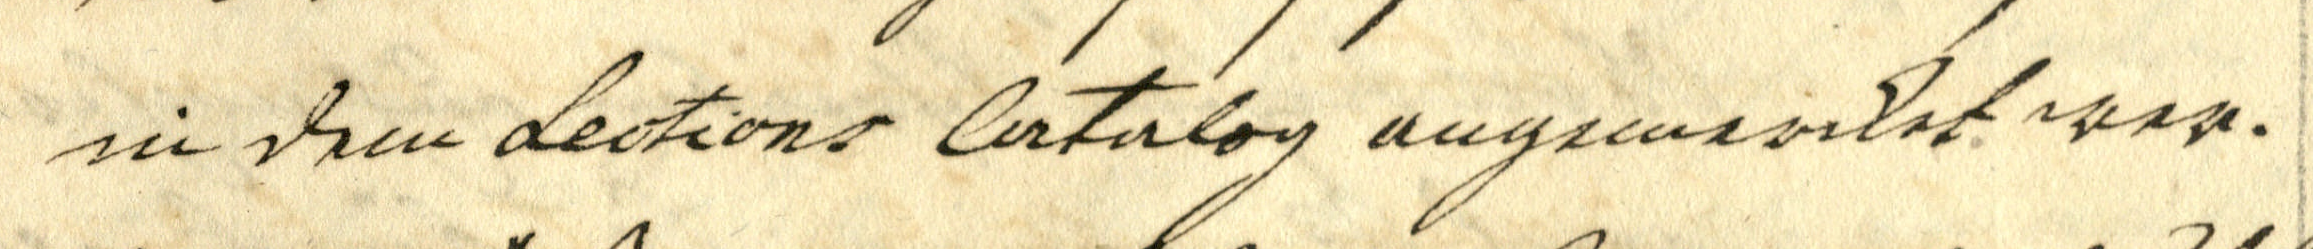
in dem Lections Catalog angemercket wer¬
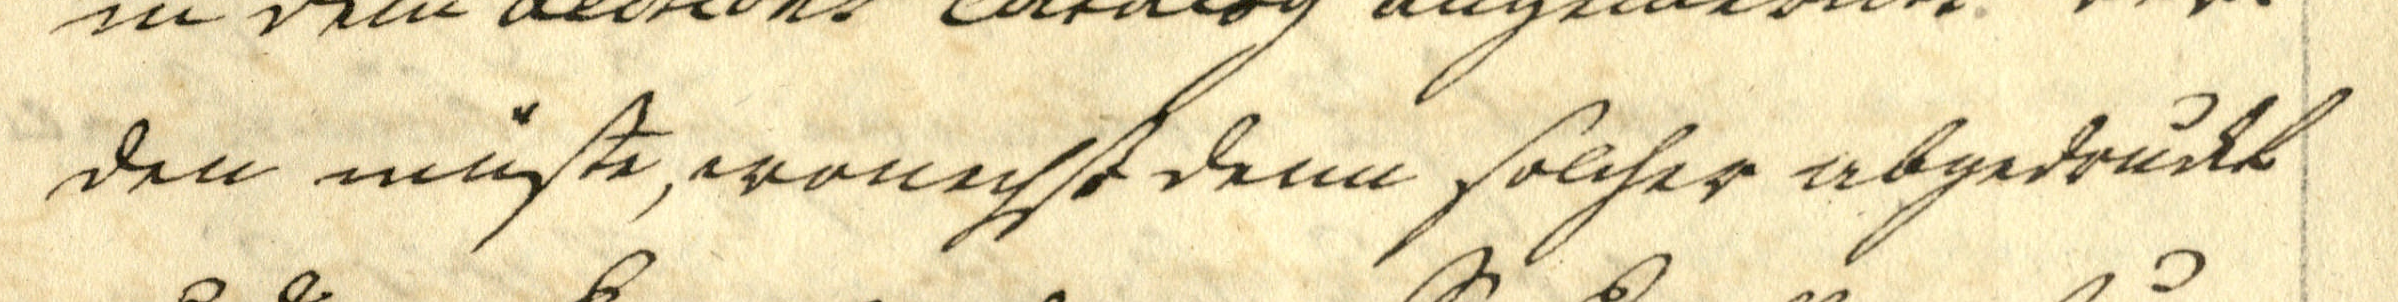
den müßte, wonechst denn solcher abgedruckt
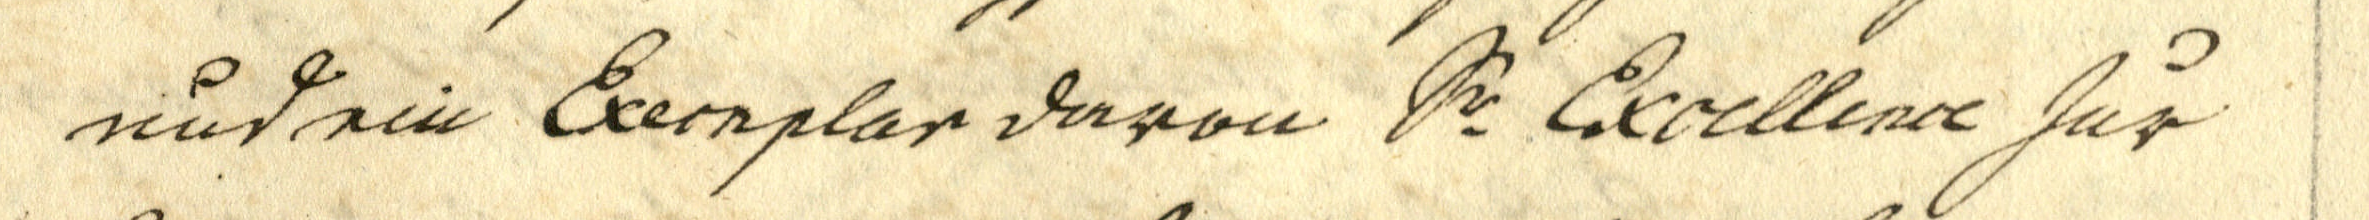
und ein Exemplar davon Sr Excellence zur
